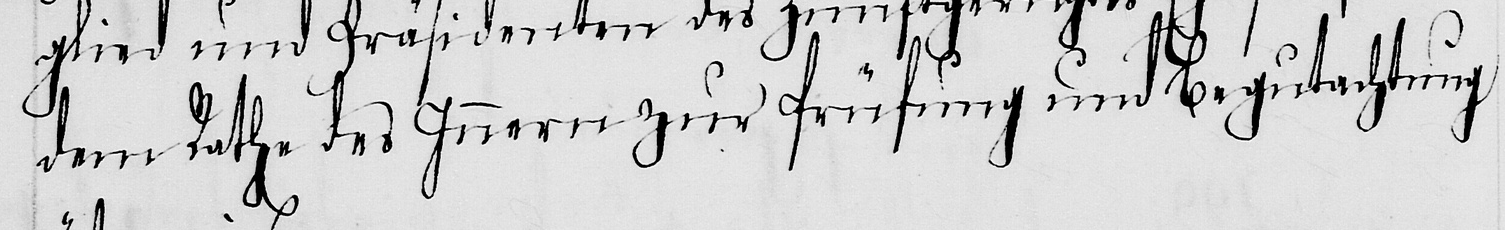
dem Rathe des Innern zur Prüfung und Begutachtung
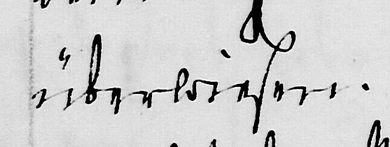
überwiesen.
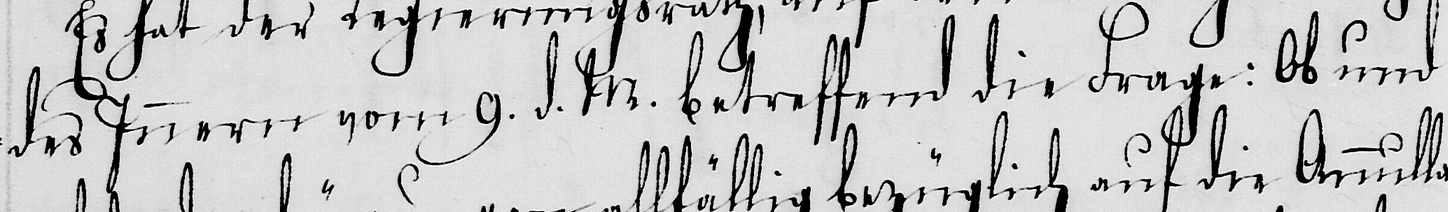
des Innern vom 9. d. M. betreffend die Frage: Ob und
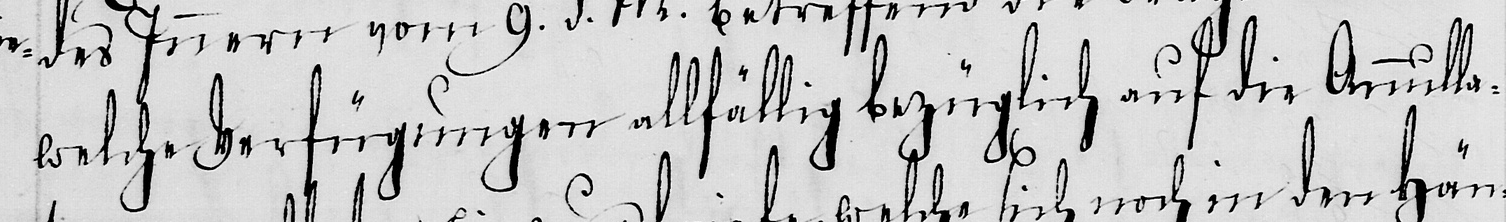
welche Verfügungen allfällig bezüglich auf die Annul¬
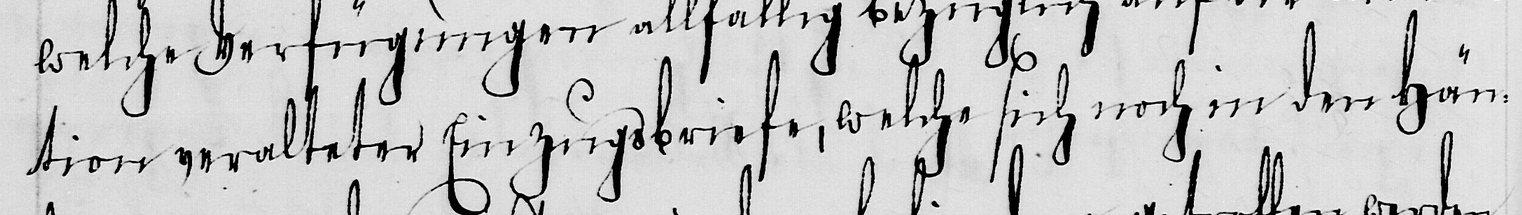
tion veralteter Einzugsbriefe, welche sich noch in den Hän¬
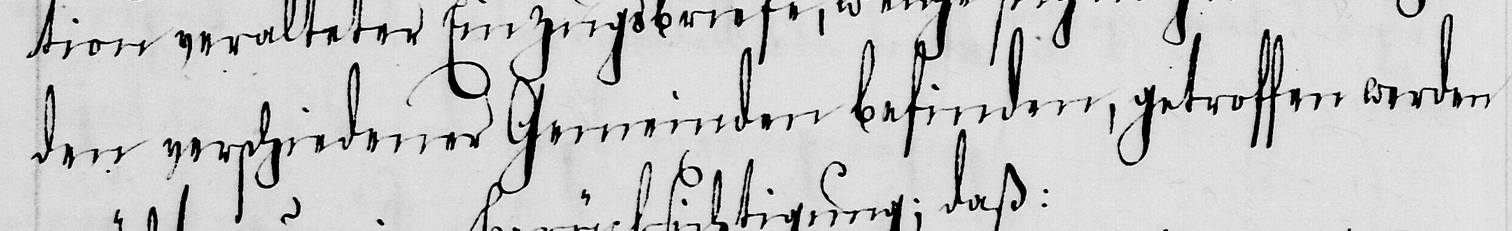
den verschiedener Gemeinden befinden, getroffen werden
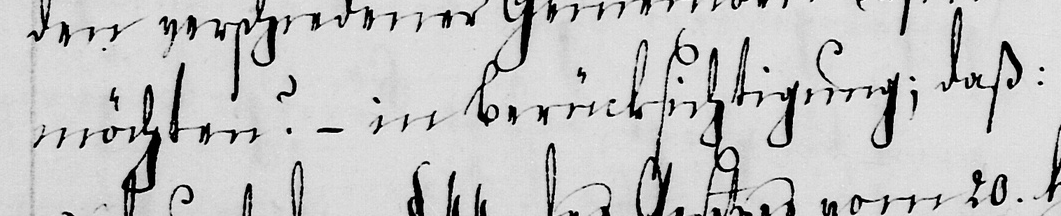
möchten? in Berücksichtigung; daß:
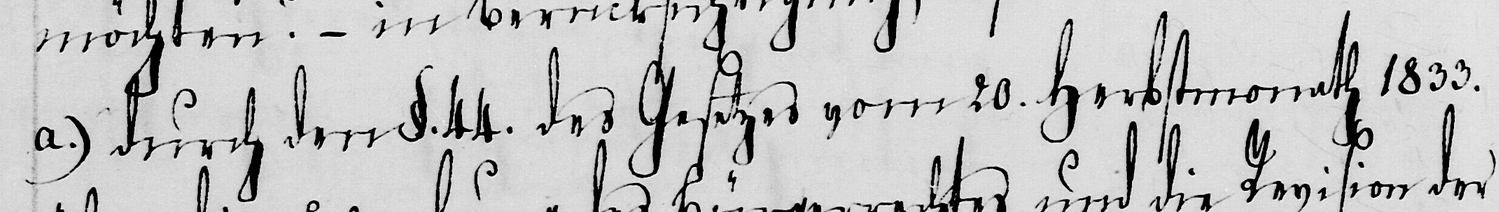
a.) durch den §. 44. des Gesetzes vom 20. Herbstmonath 1833.
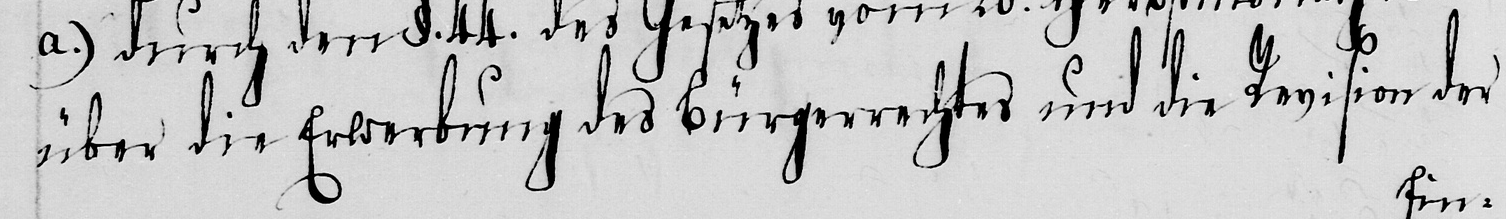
über die Erwerbung des Bürgerrechtes und die Revision der
